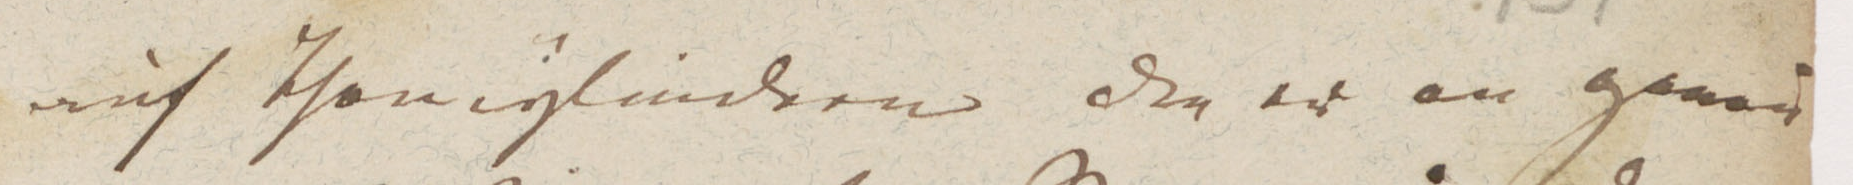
auf Thoncylindern die er an genau
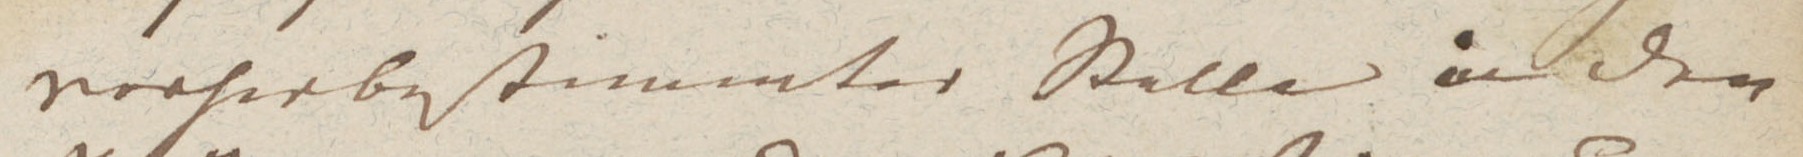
vorherbestimmter Stelle in den
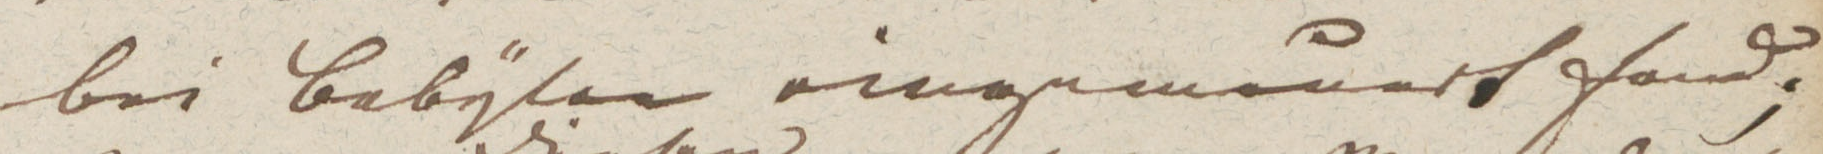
bei Babylon eingemauert fand;
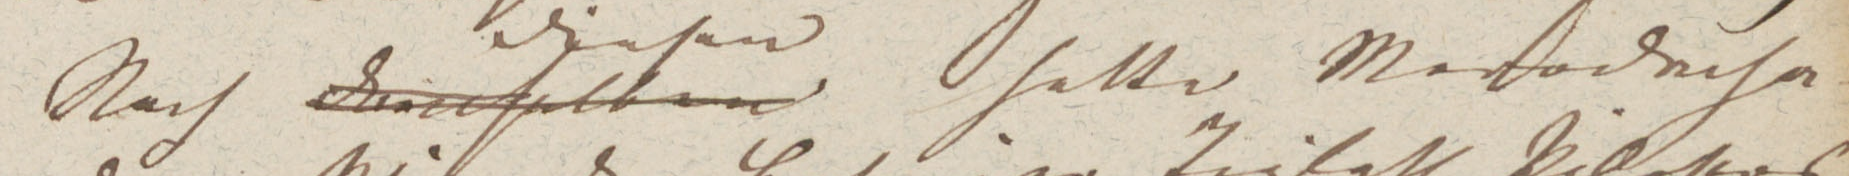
Nach denselben diesen hatte Merodacha
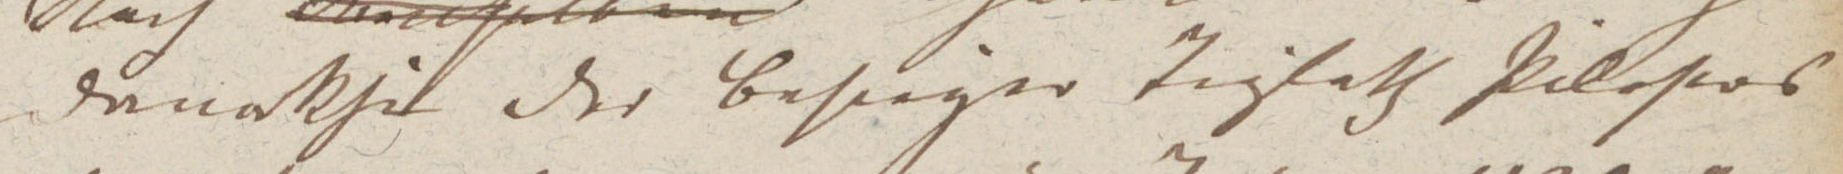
Danakhi der Besieger Tiglath Pilesers
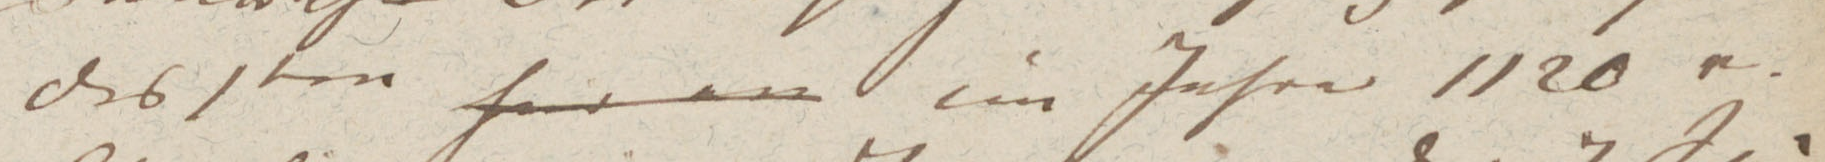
des 1ten hier an im Jahre 1120 v.
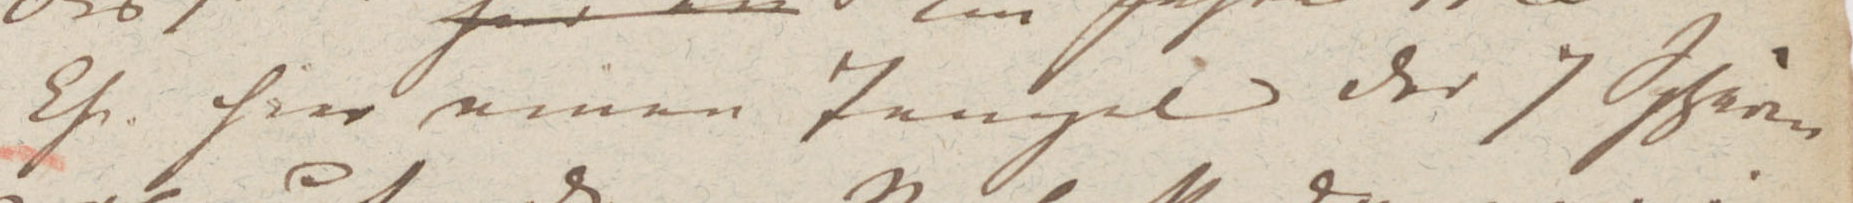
Ch. hier einen Tempel der 7 Sphären
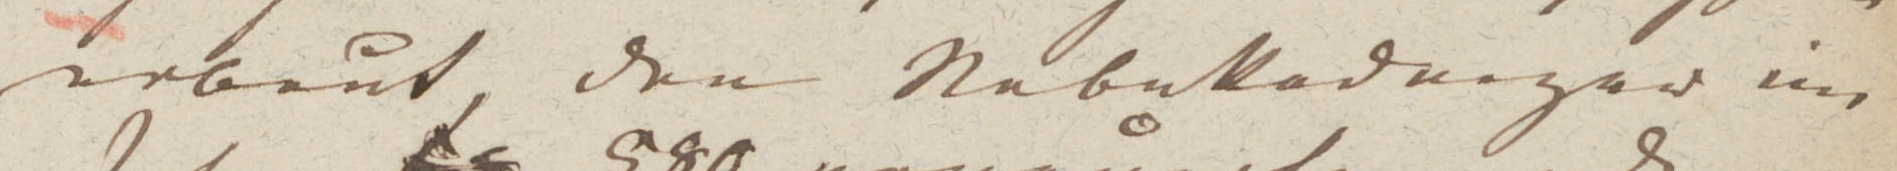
erbaut, den Nebukadnezar im
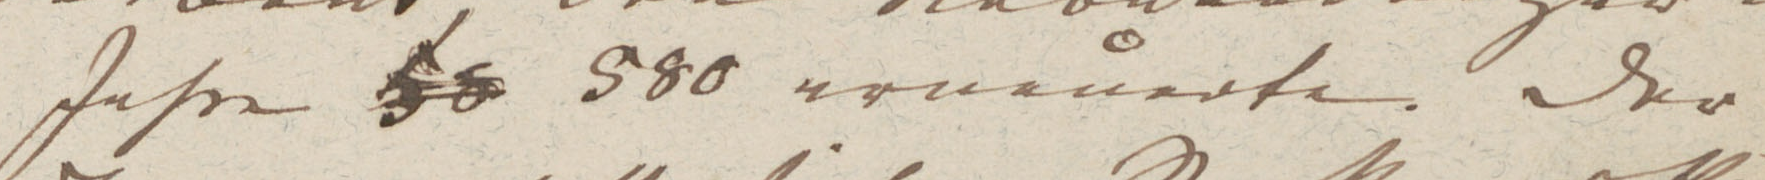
Jahre 58 580 erneuerte. Der
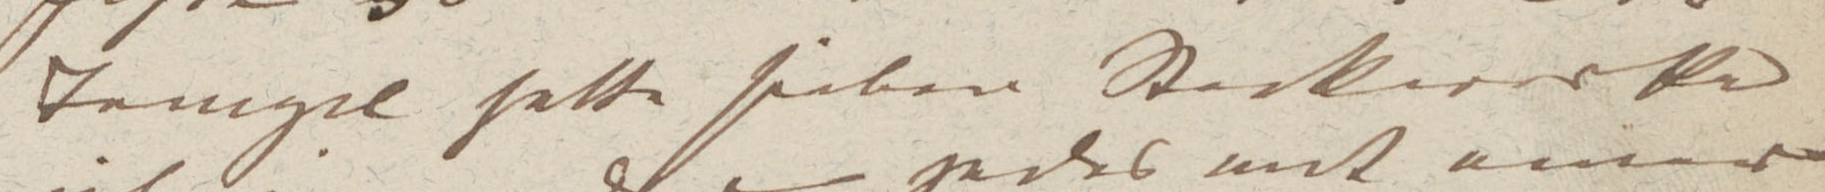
Tempel hatte sieben Stockwerke
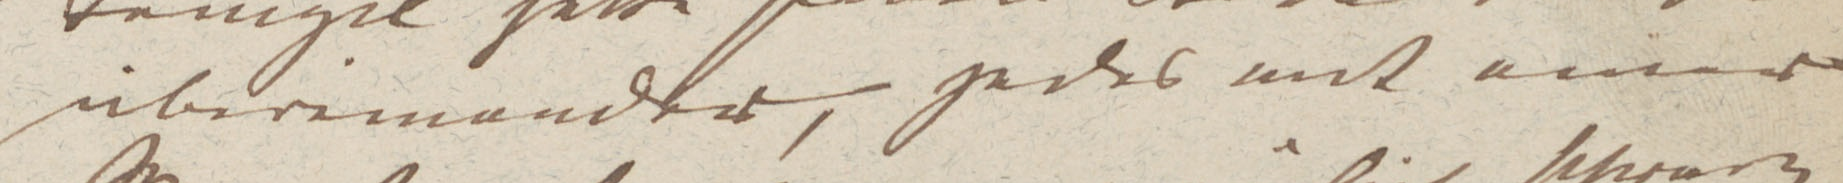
übereinander, jedes mit einer
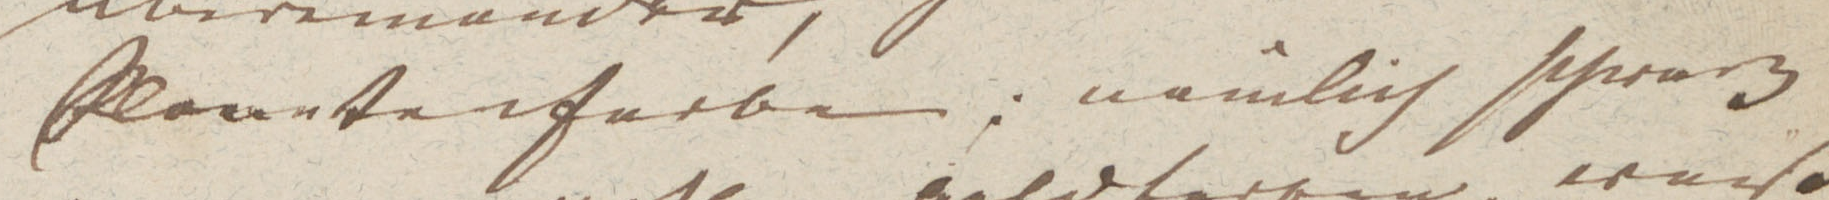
Planetenfarbe; nämlich schwarz
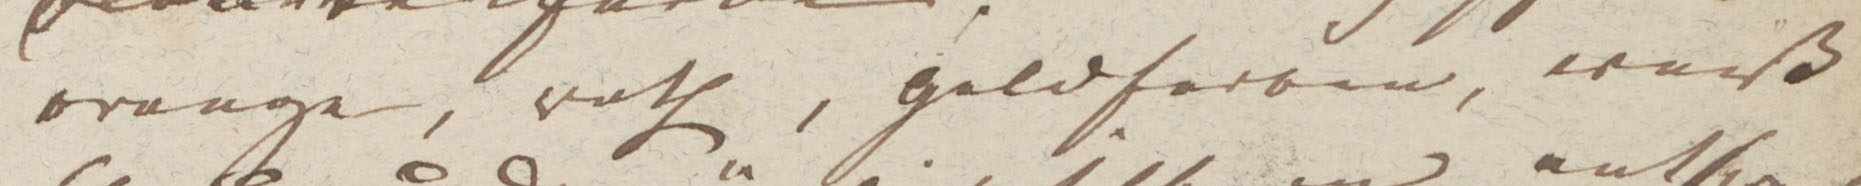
orange, roth, goldfarben, weiss
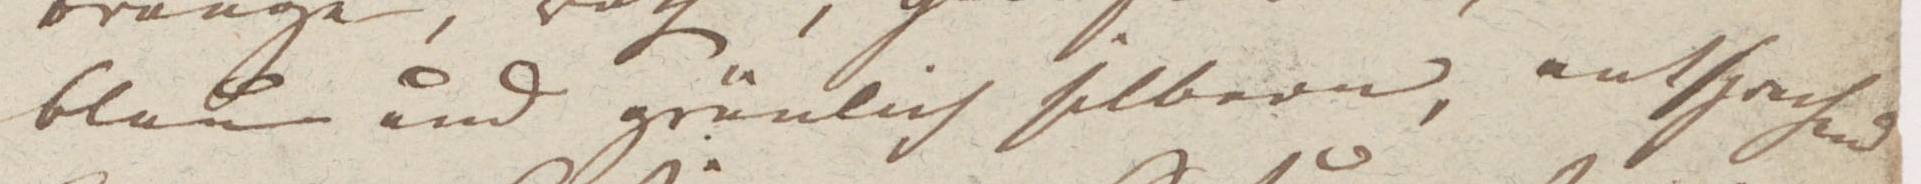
blau und grünlich silbern, entsprechend
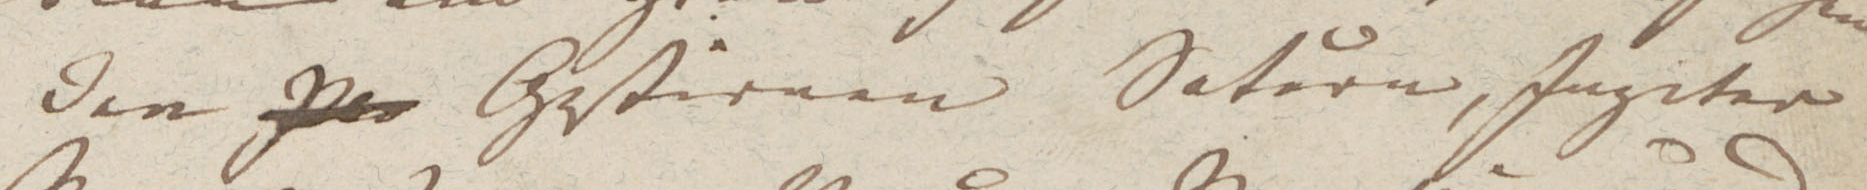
den Pla Gestirnen Saturn, Jupiter
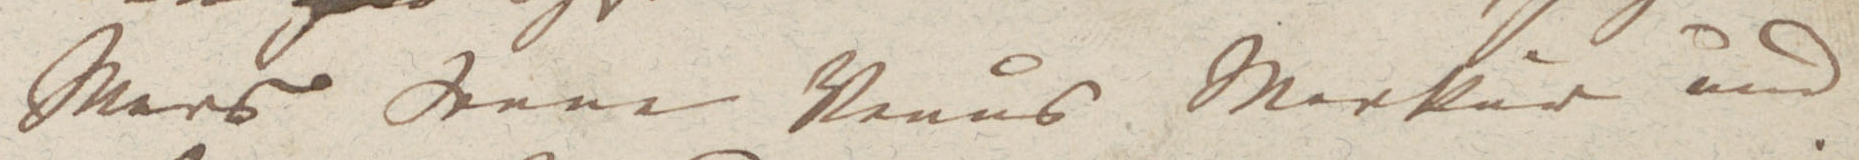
Mars Sonne Venus Merkur und
